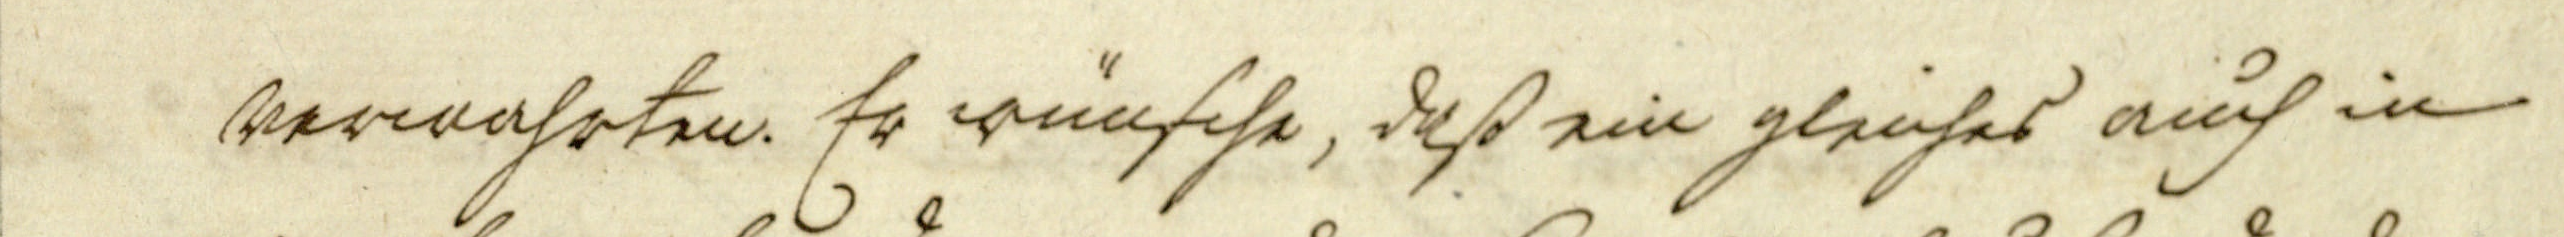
verwahrten. Er wünsche, daß ein gleiches auch in
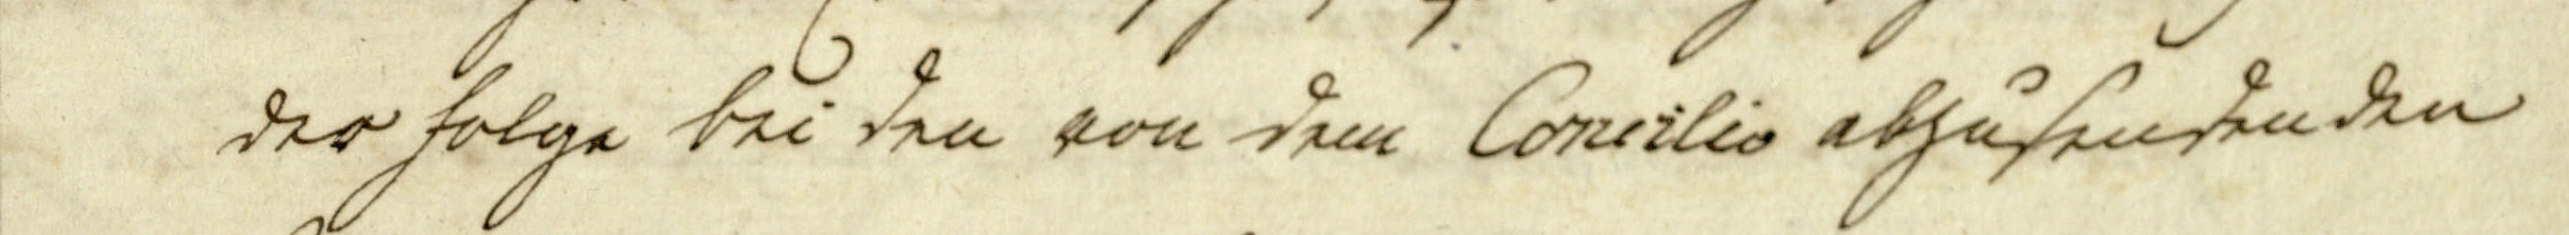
der Folge bei den von dem Concilio abzusendenden
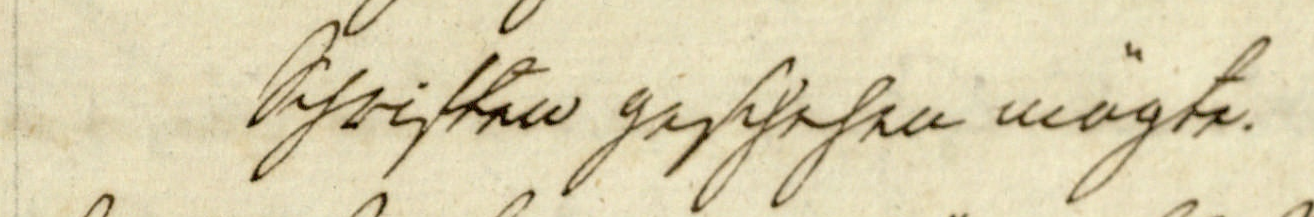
Schriften geschehen mögte.
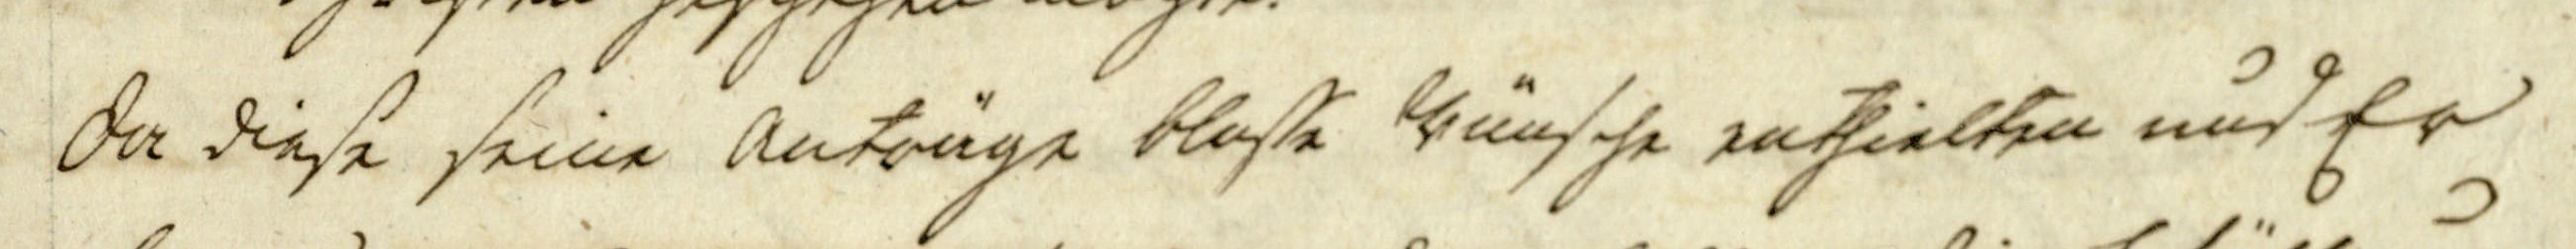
Da diese, seine Anträge blosse Wünsche enthielten und Er
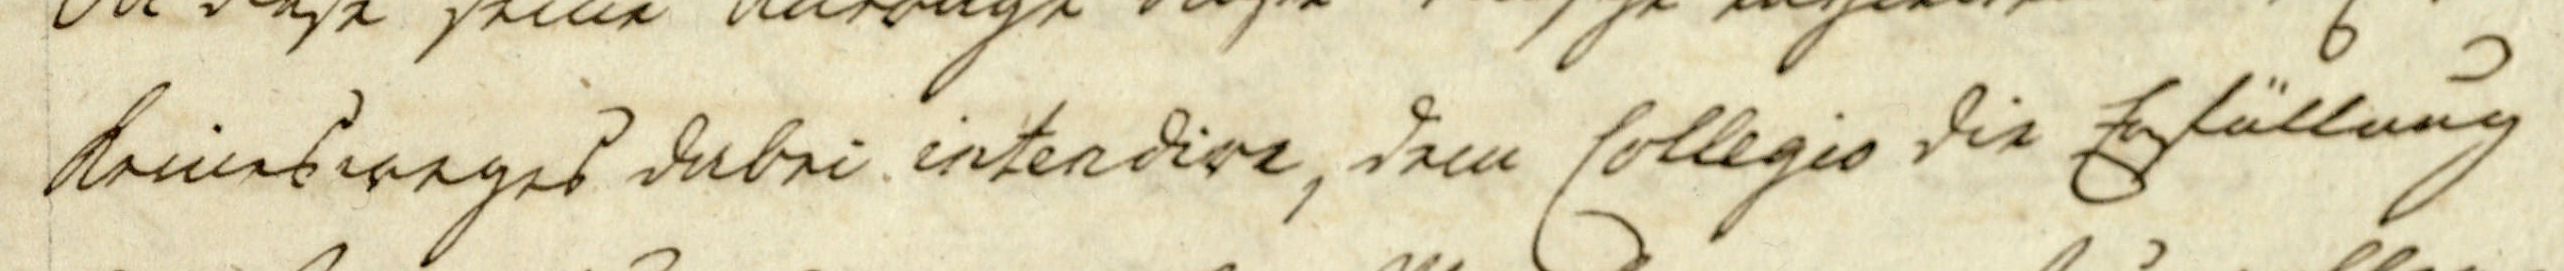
keines weges dabei intendire, dem Collegio die Erfüllung
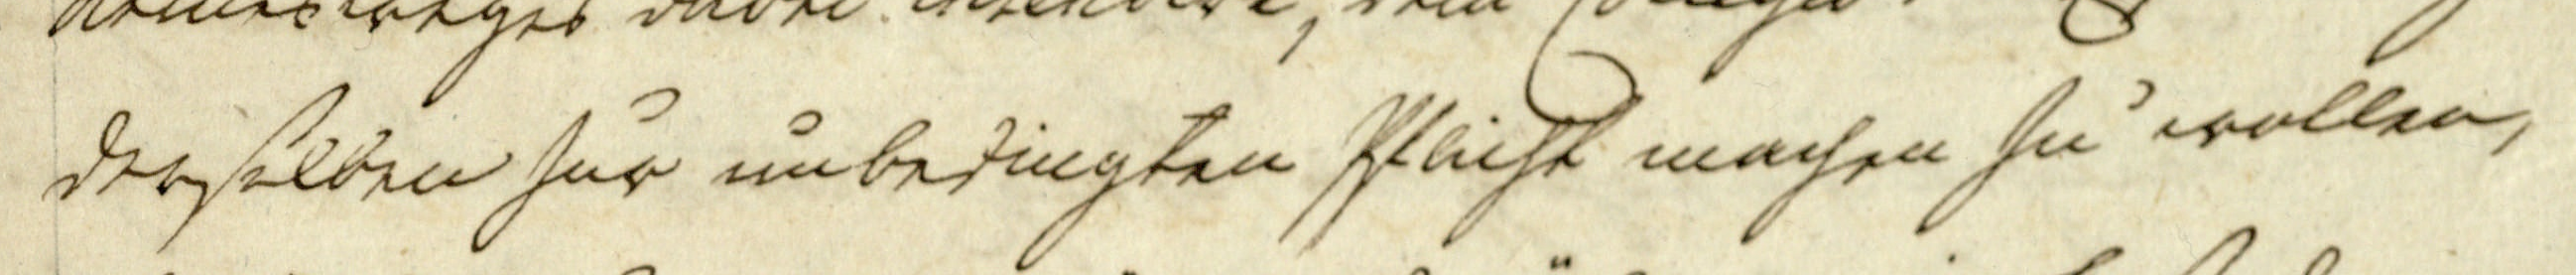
derselben zur unbedingten Pflicht machen zu wollen,
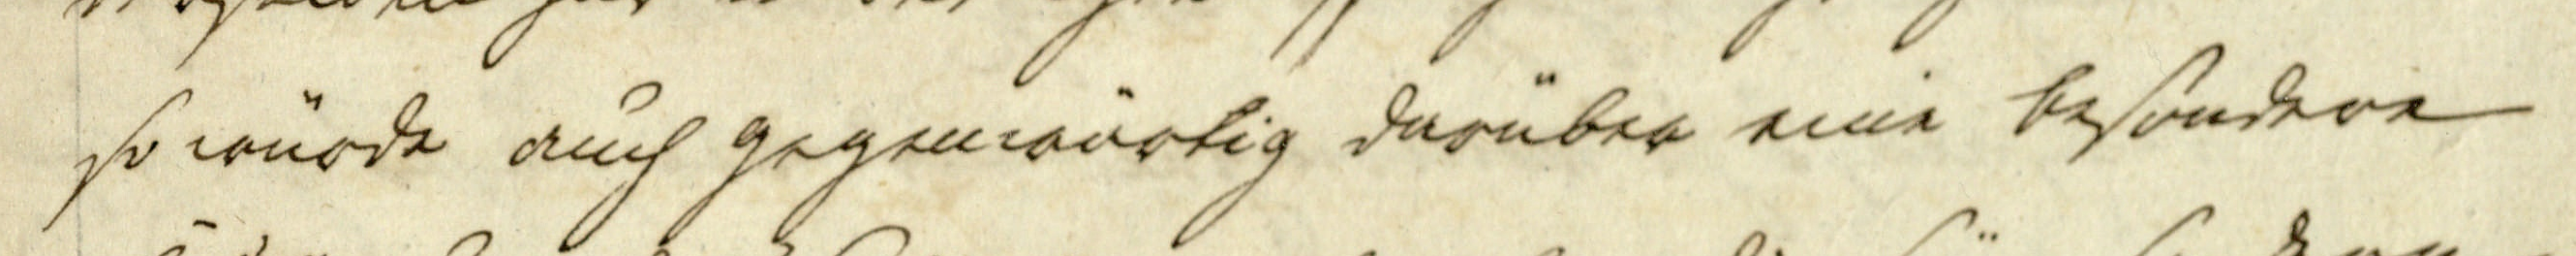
so würde auch gegenwärtig darüber eine besondere
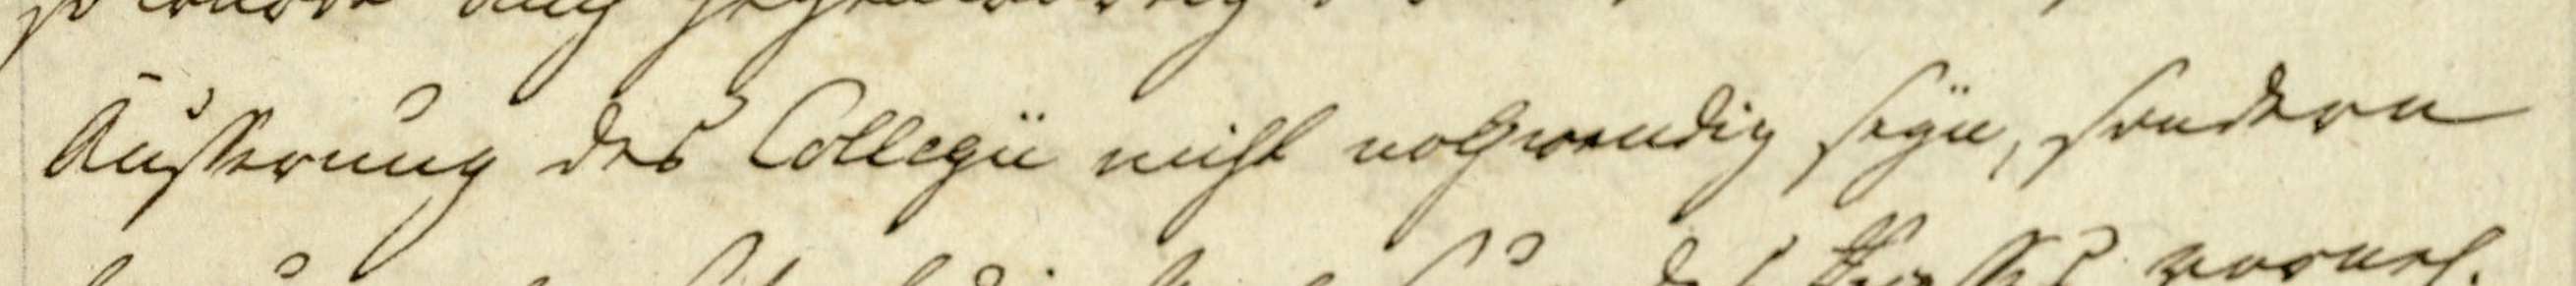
Äusserung des Collegii nicht nothwendig seÿn, sondern
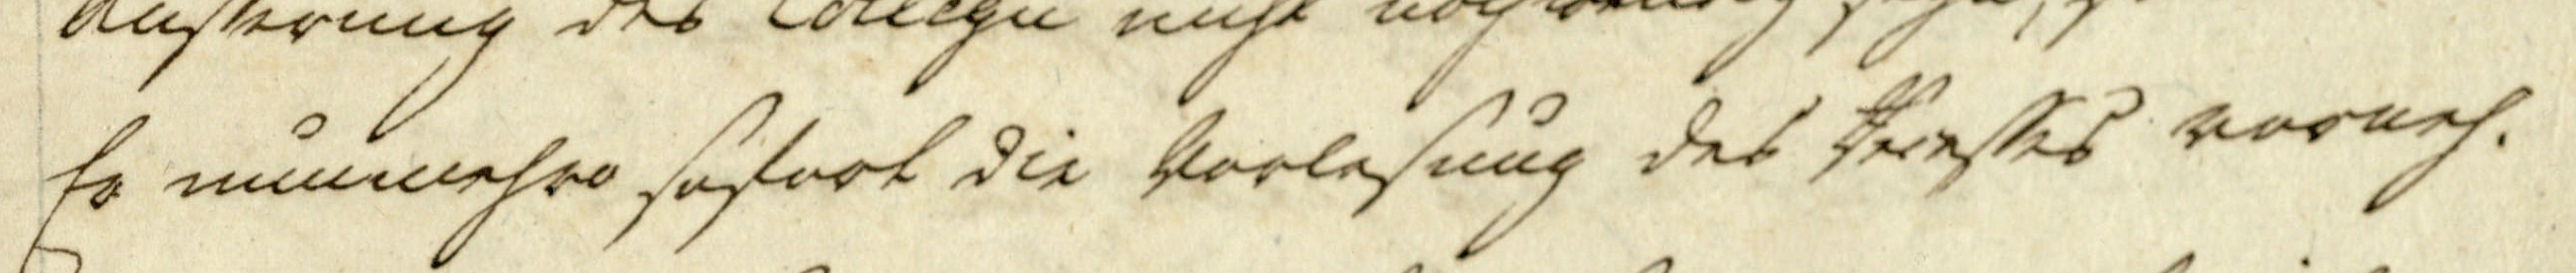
Er nunmehro sofort die Verlesung des Recesses vorneh¬
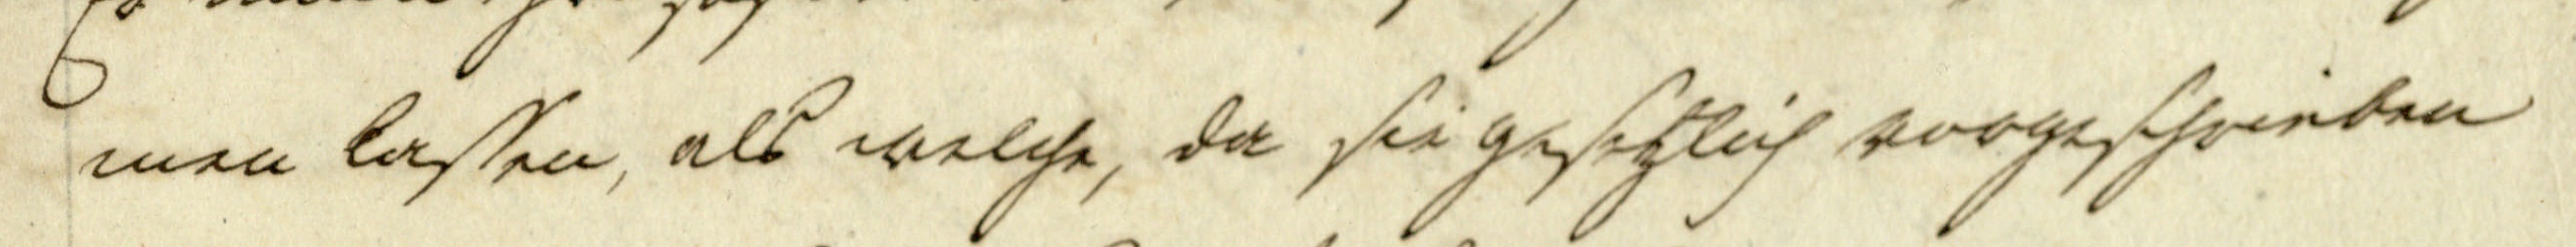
men lassen, als welche, da sie gesetzlich vorgeschrieben
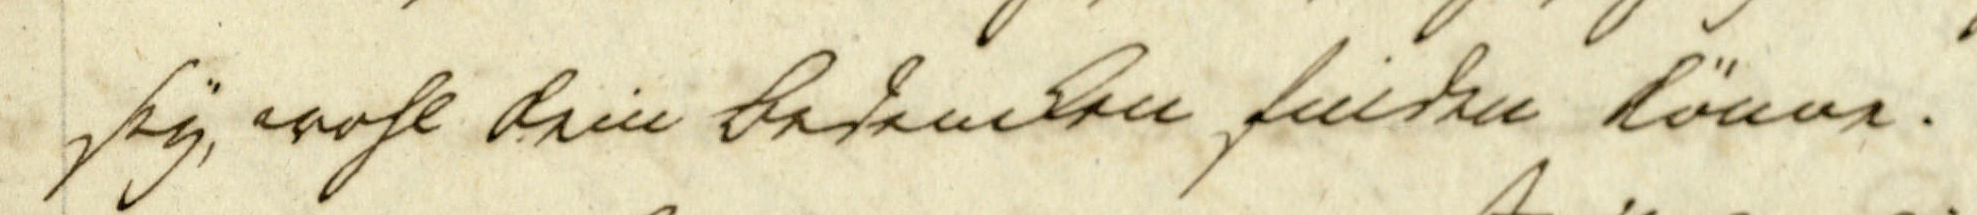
seÿ, wohl kein Bedencken finden könne.
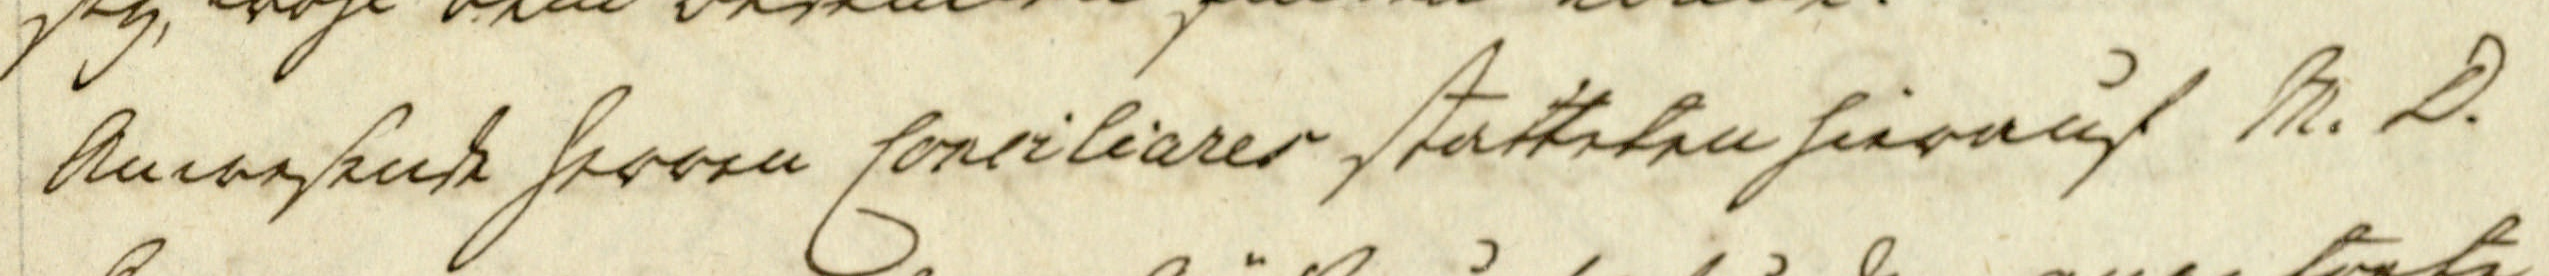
Anwesende herren Conciliares statteten hierauf M. D.
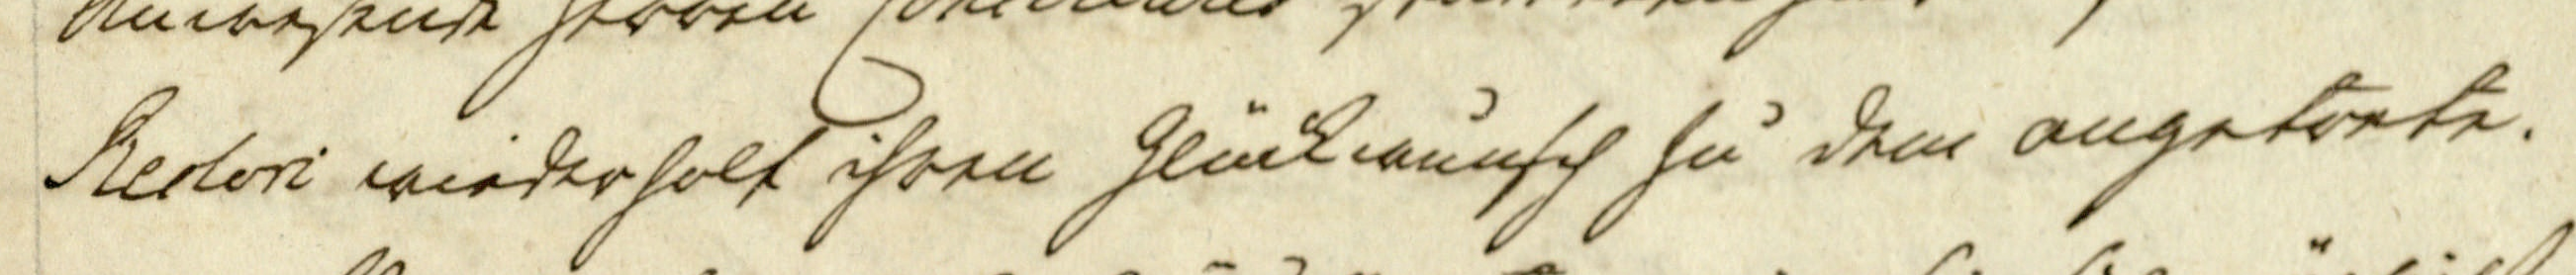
Rectori wiederholt ihren Glückwunsch zu dem angetrete¬
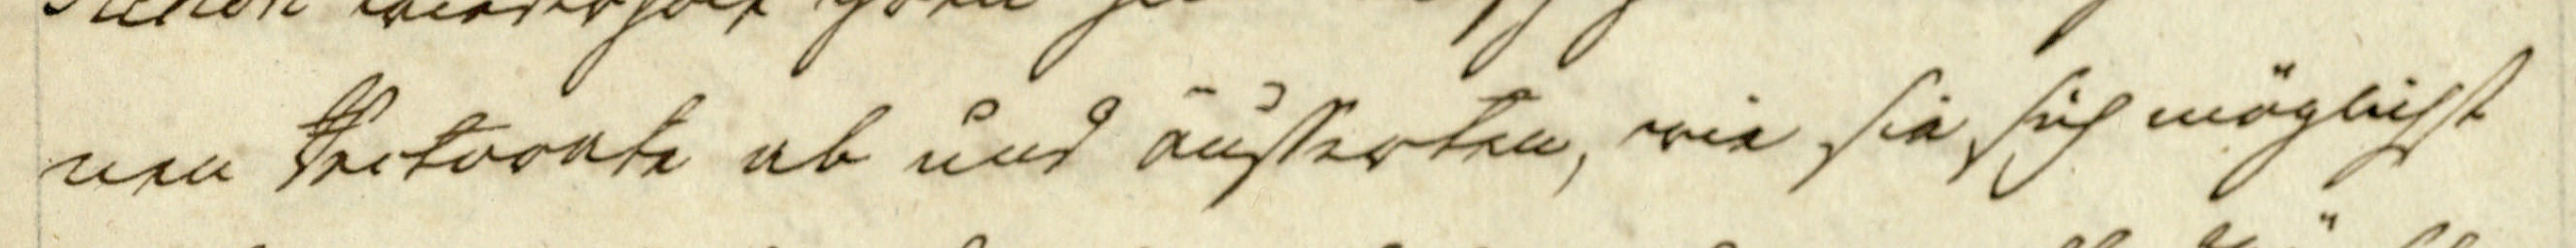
nen Rectorate ab und äusserten, wie sie sich möglichst
